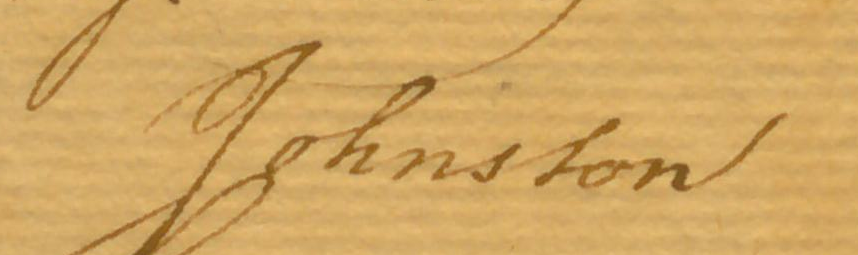Johnston
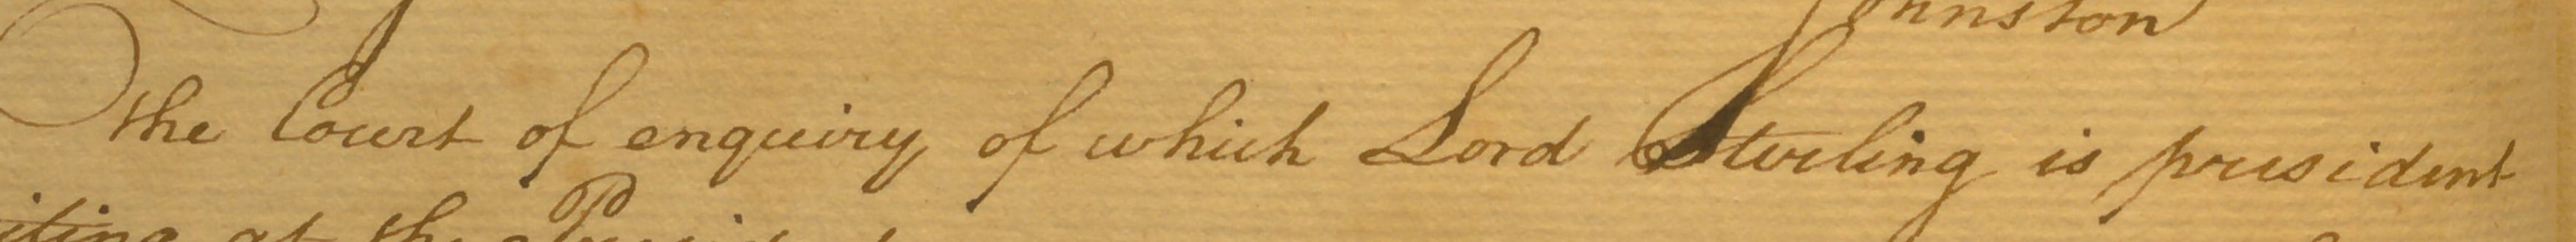The Court of enquiry of which Lord Sterling is president
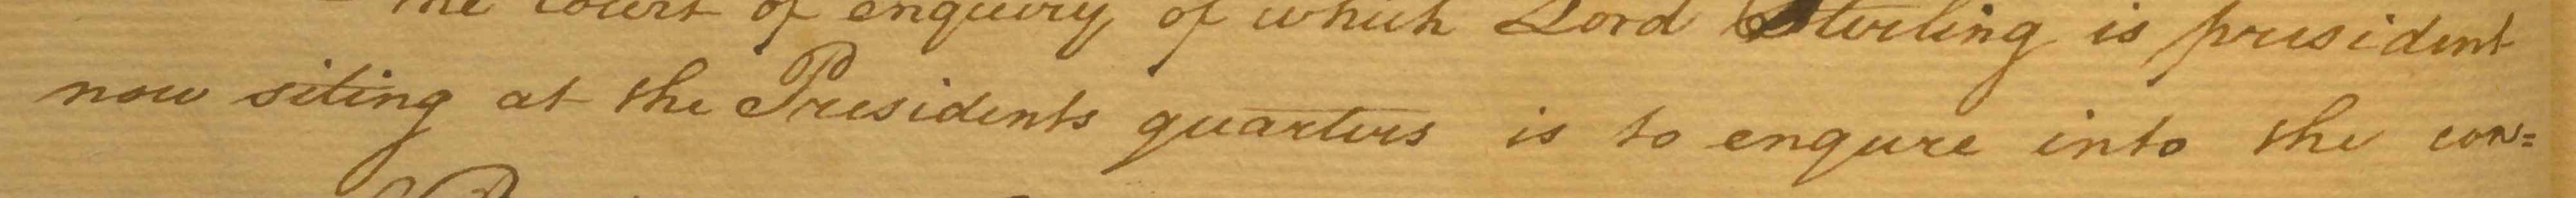now siting at the Presidents quarters is to enquire into the con-
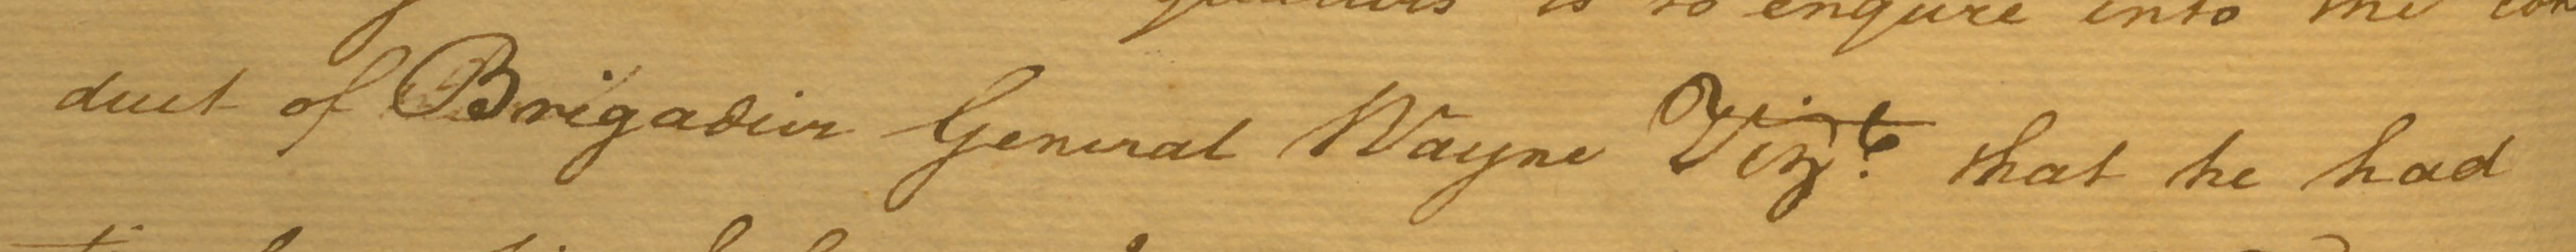duct of Brigadier General Wayne Viz^t. that he had
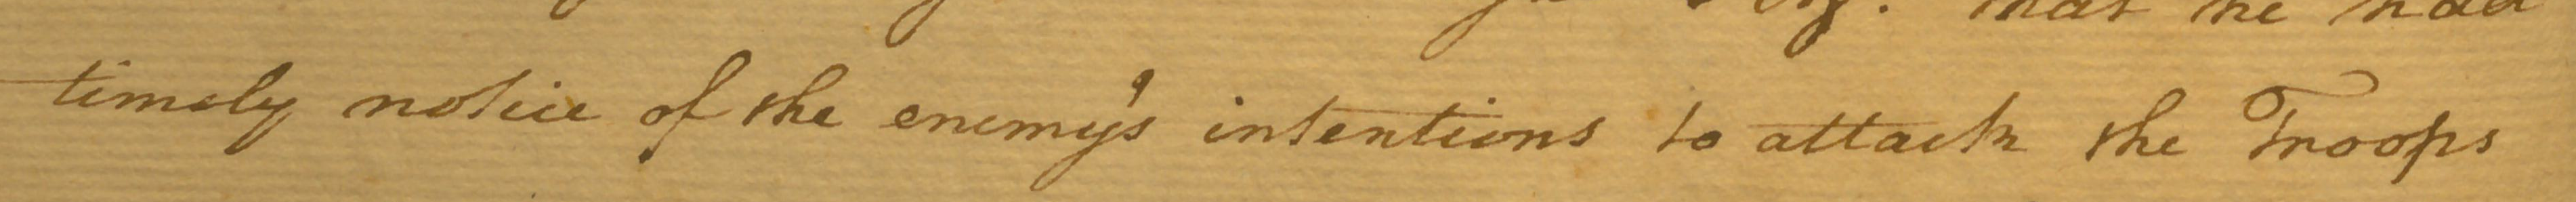timely notice of the enemy's intentions to attack the Troops
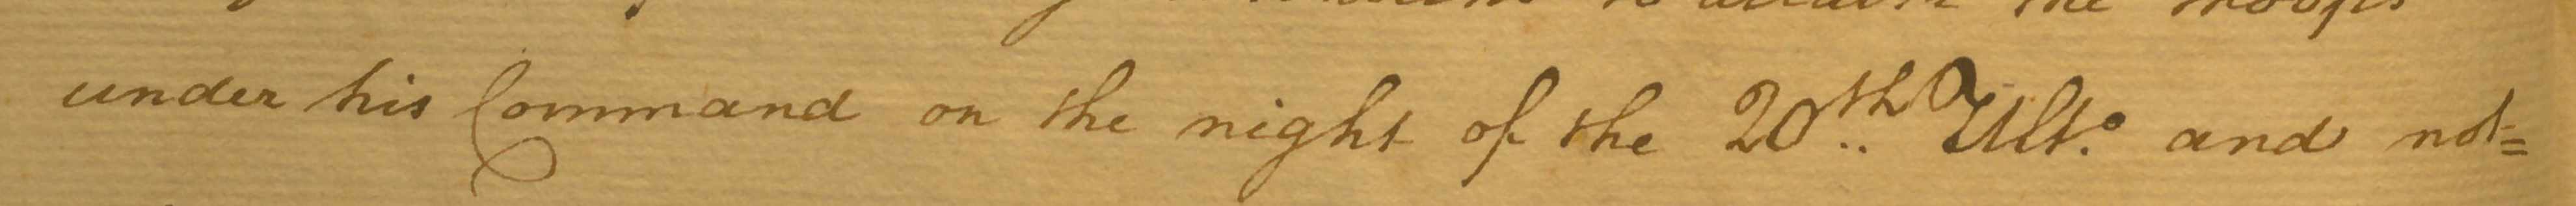under his Command on the night of the 20^th. Ult^o. and not-
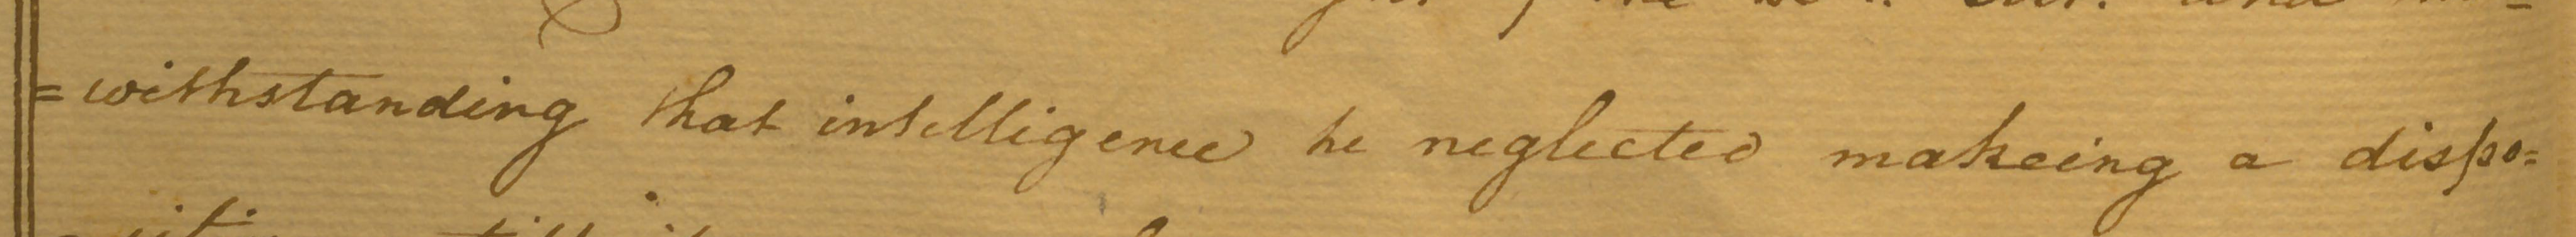-withstanding that intelligence he neglected making a dispo-
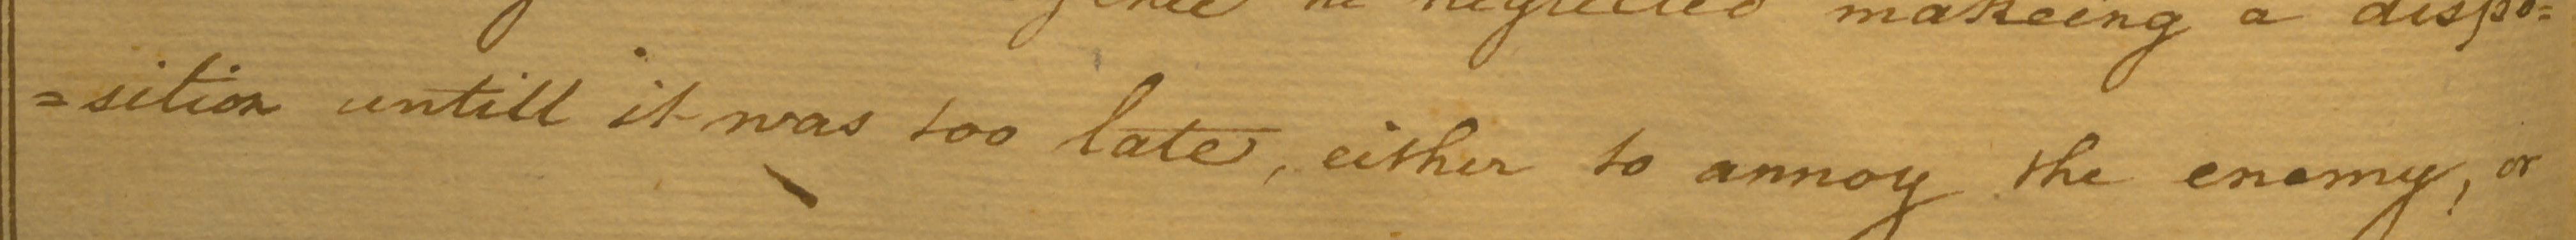-sition untill it was too late, either to annoy the enemy, or
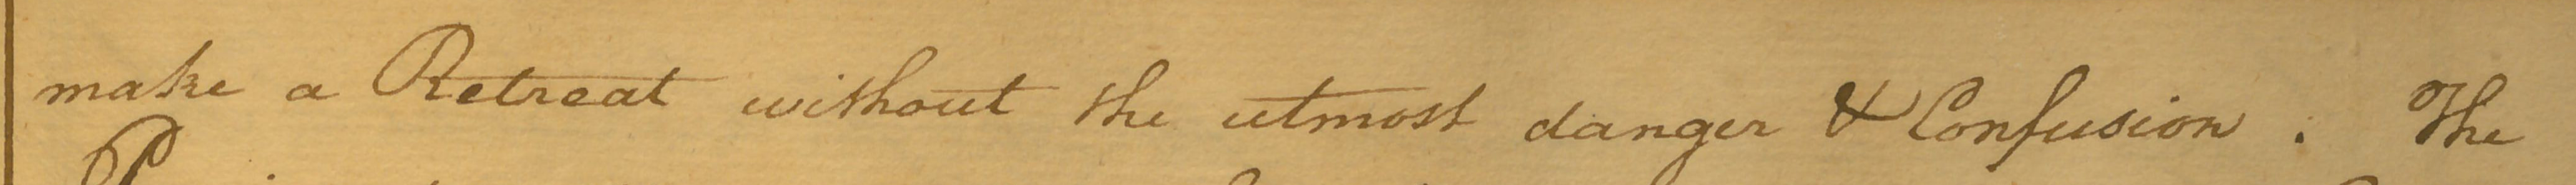make a Retreat without the utmost danger & Confusion. The
